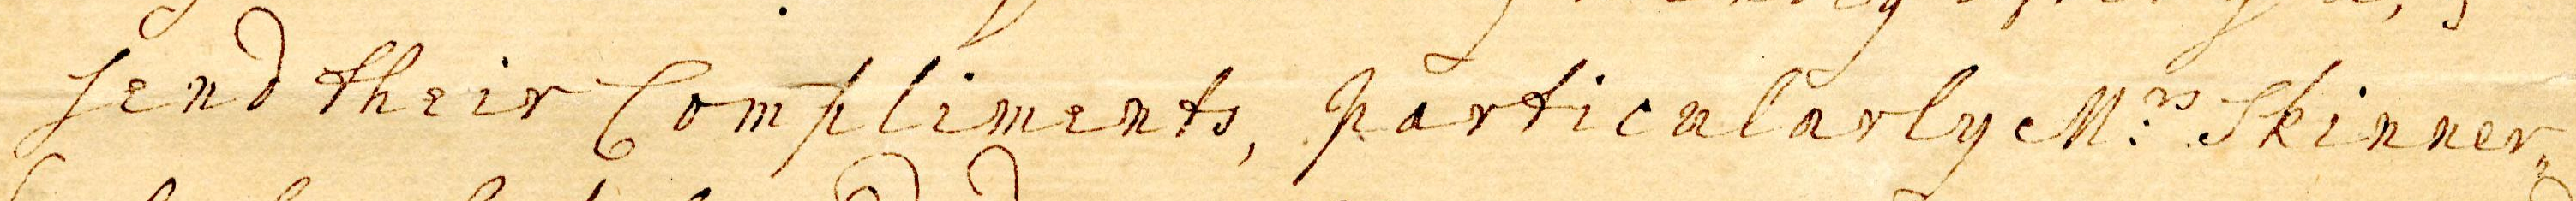send their Compliments, particularly M^rs: Skinner
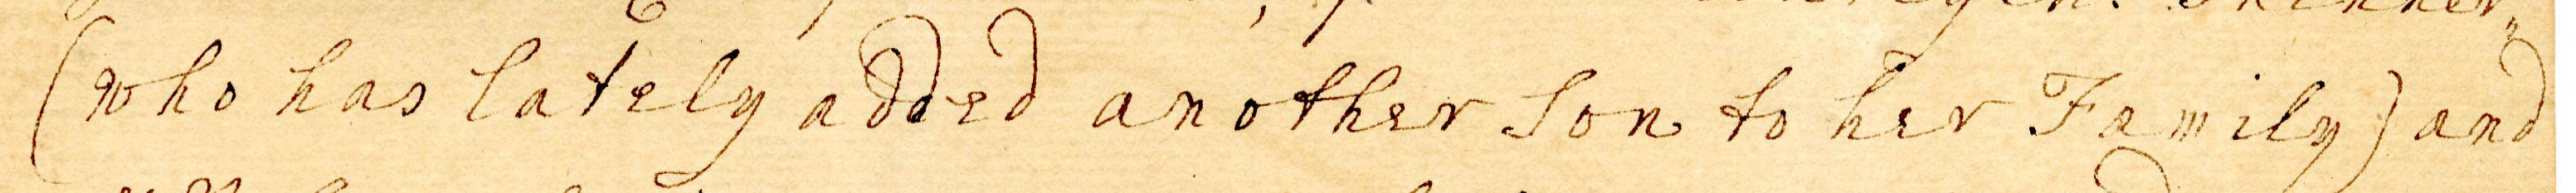(who has lately added another son to her Family) and
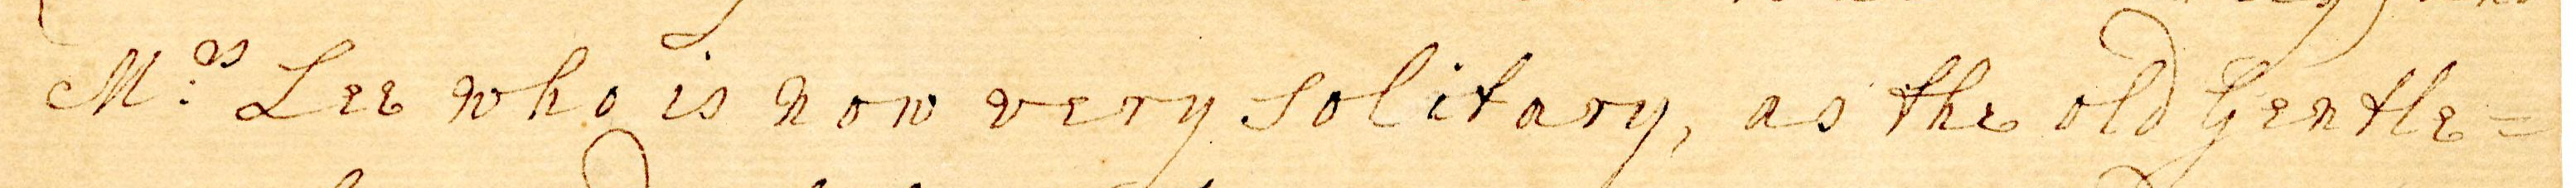M^rs: Lee who is now very solitary, as the old Gentle-
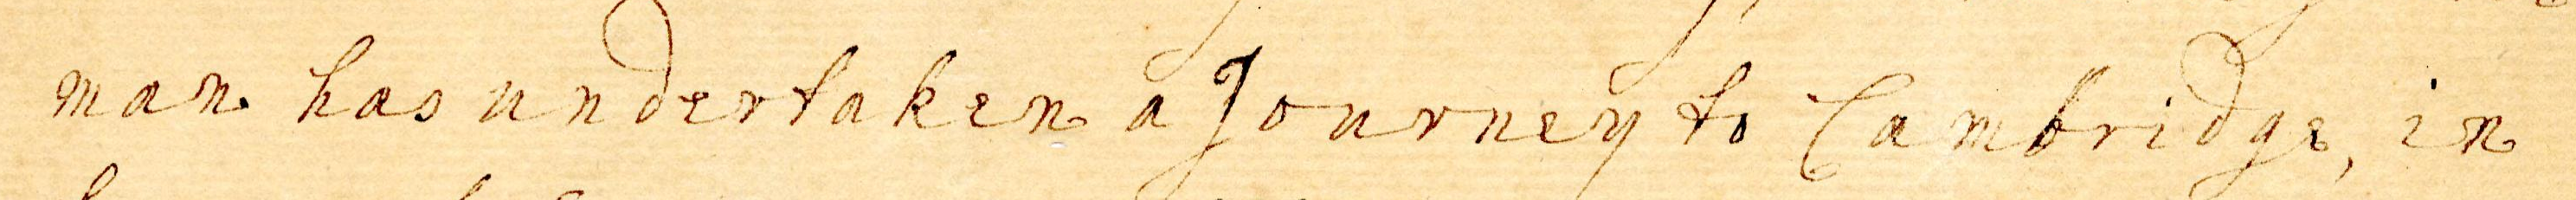man has undertaken a Journey to Cambridge, in
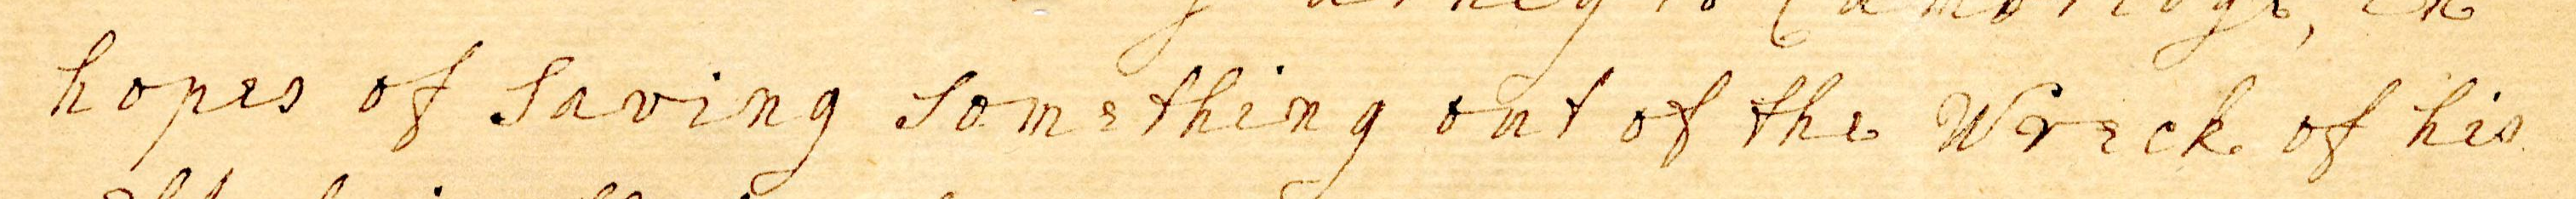hopes of saving something out of the Wreck of his
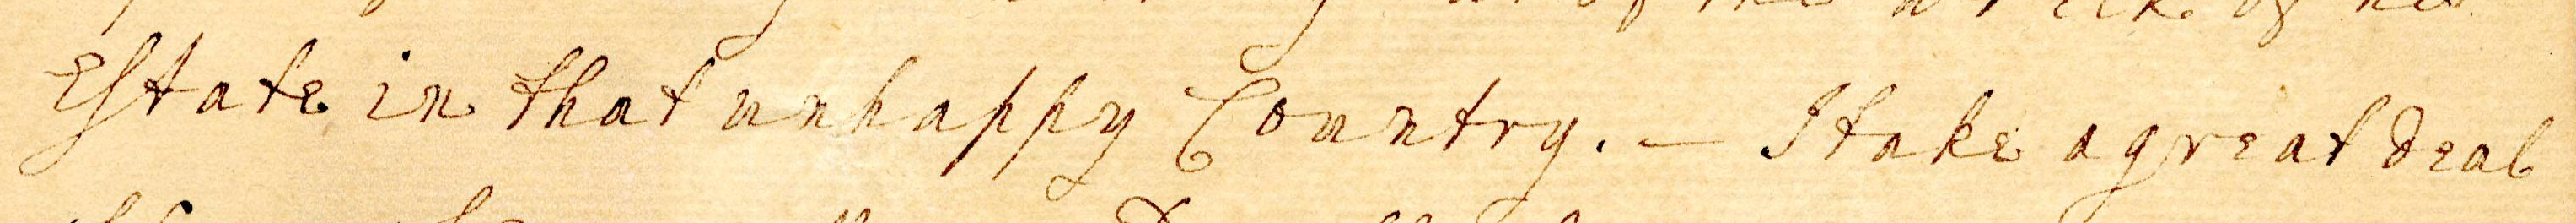Estate in that unhappy Country.- Stake a great deal
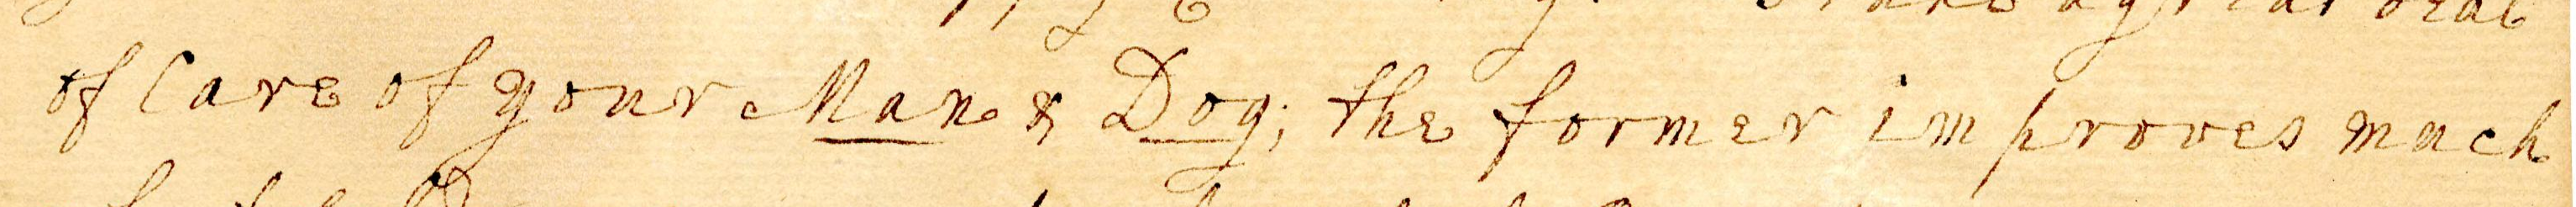of Care of your Man & Dog; the former improves much
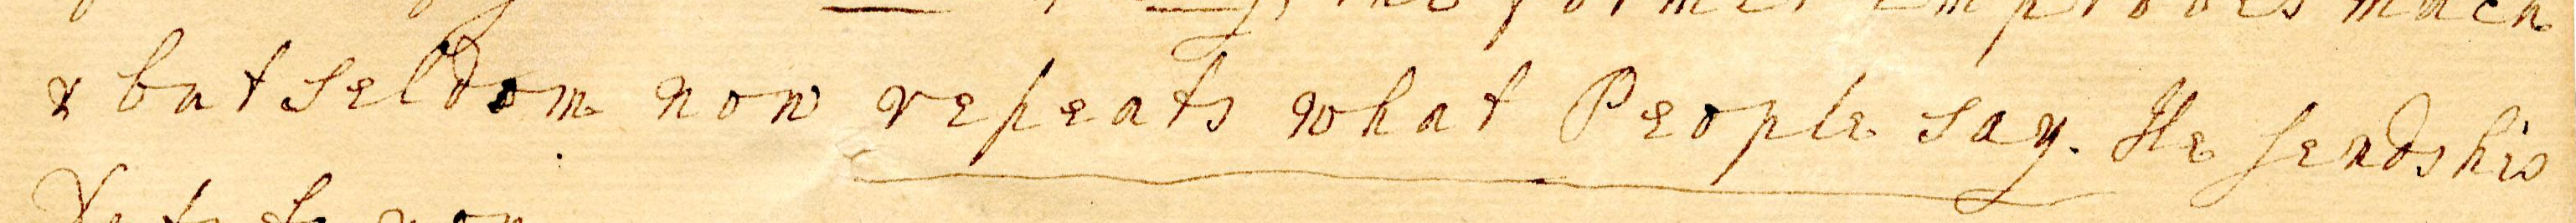& but seldom now repeats what People say. He sends his
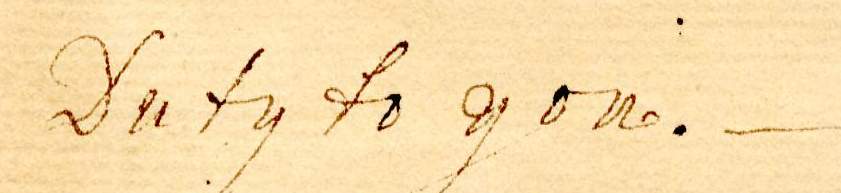Duty to you.-
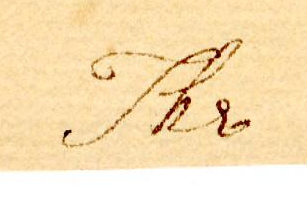The
